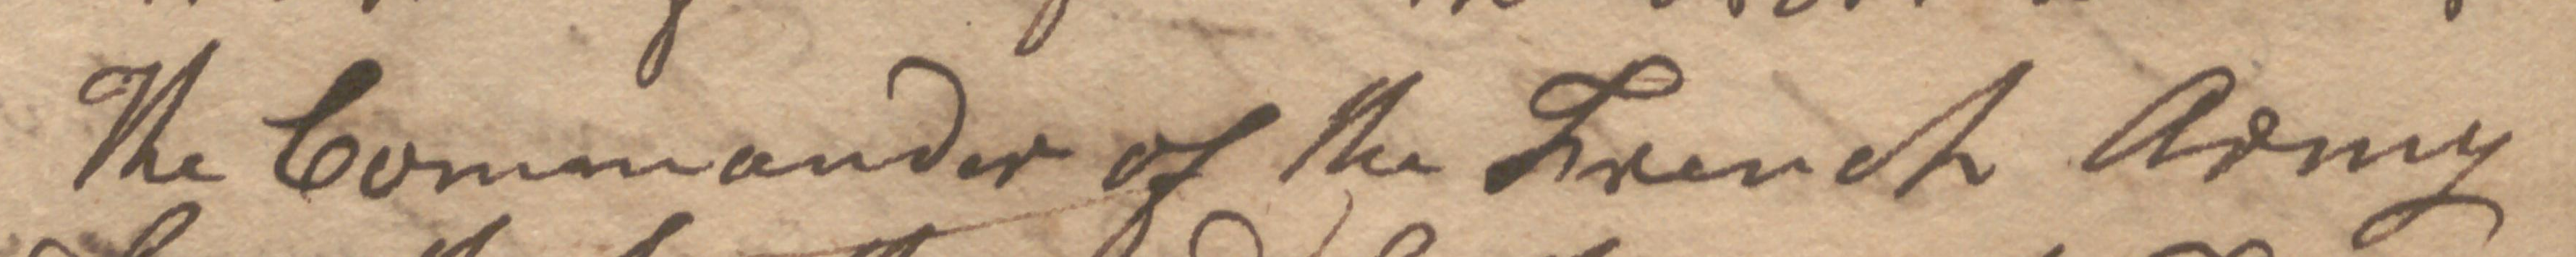The Commander of the French Army
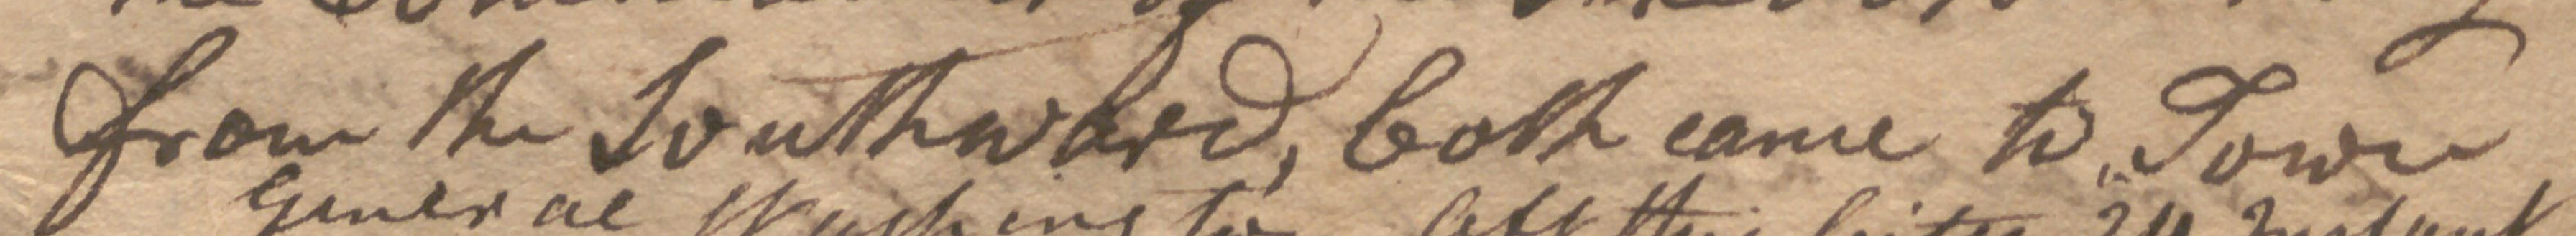from the Southward, both came to Town
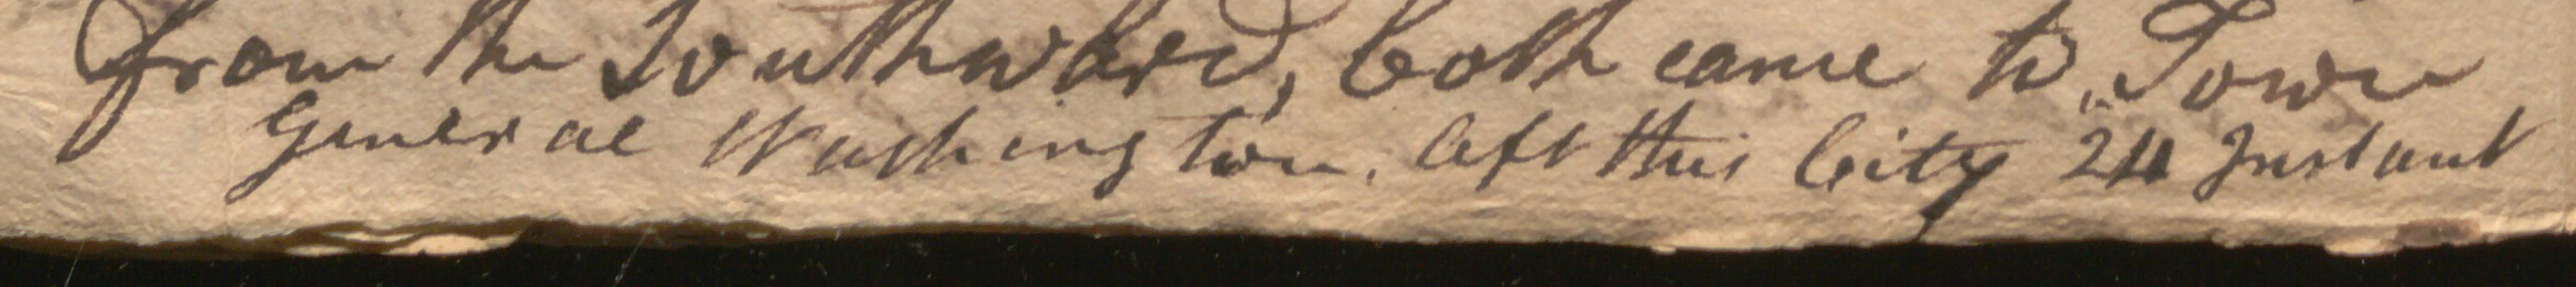General Washington, left this City 24 Instant
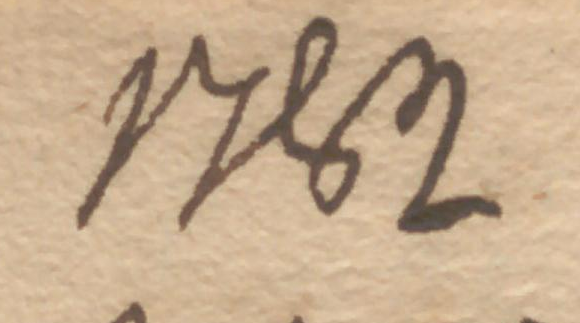1782
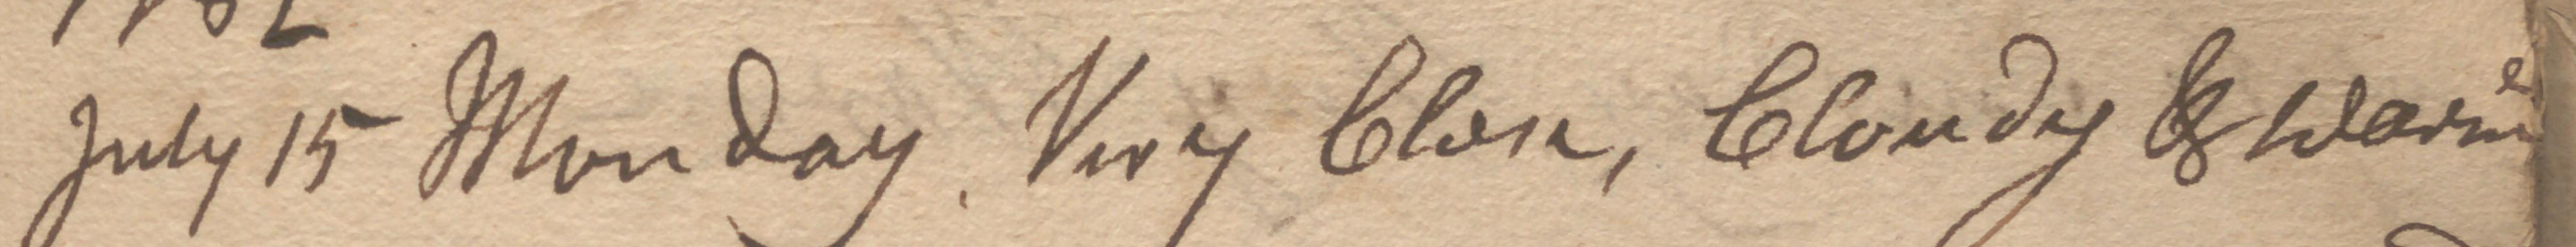July 15 Monday, Very Close, Cloudy & Warm^e
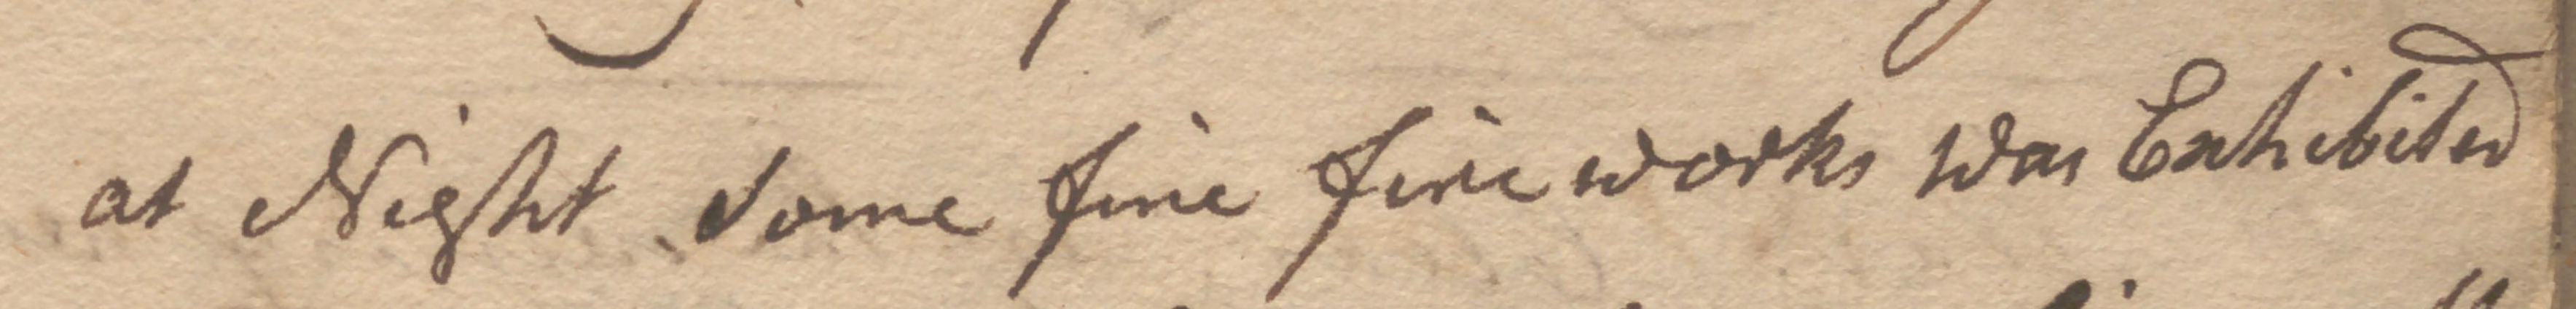at Night some fine fire works was Exhibited
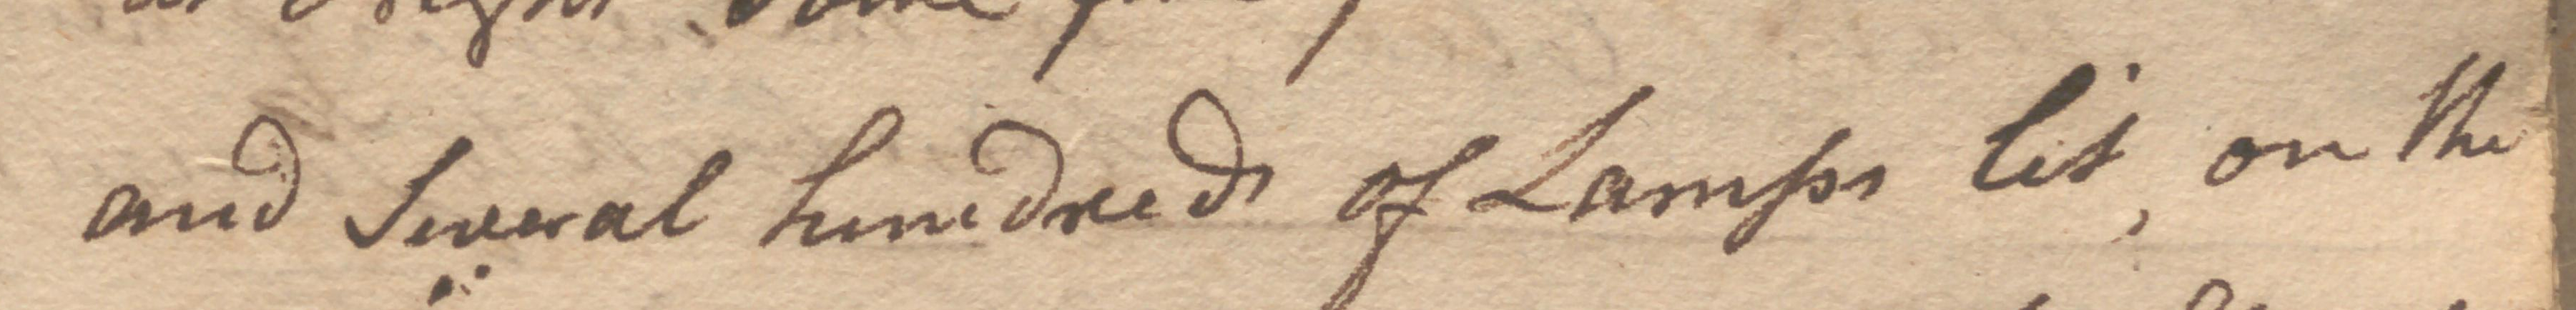and Several hundreds of Lamps lit on the
